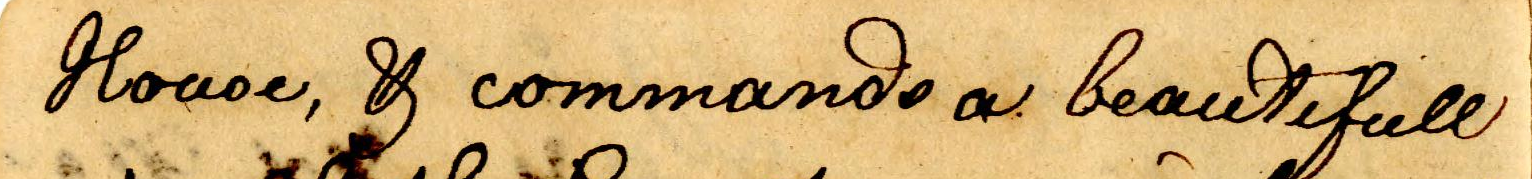House, & commands a beautifull
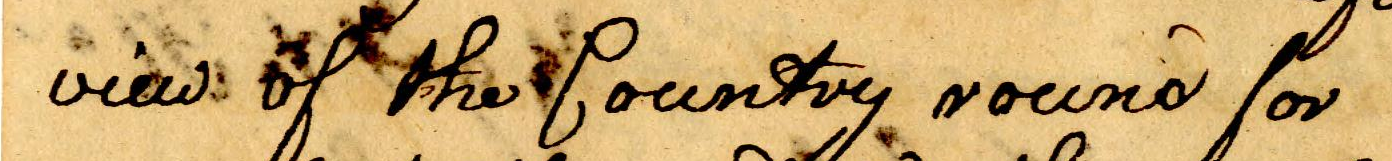view of the Country round for
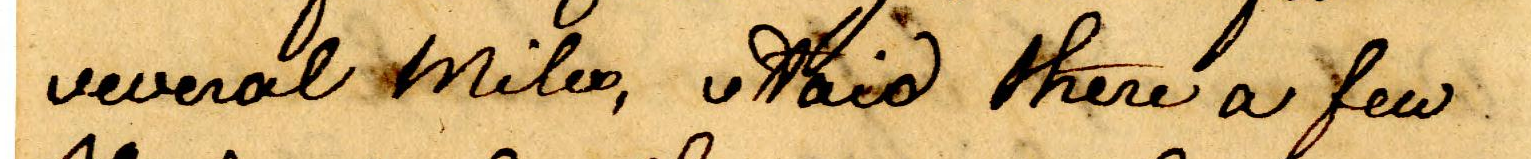several Miles, staid there a few
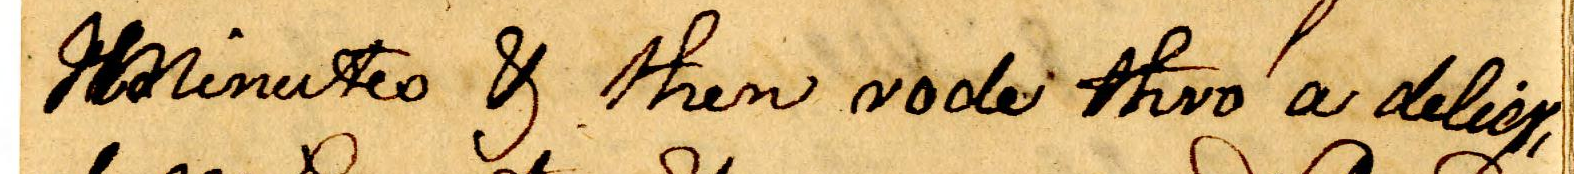Minutes & then rode thro' a delig-
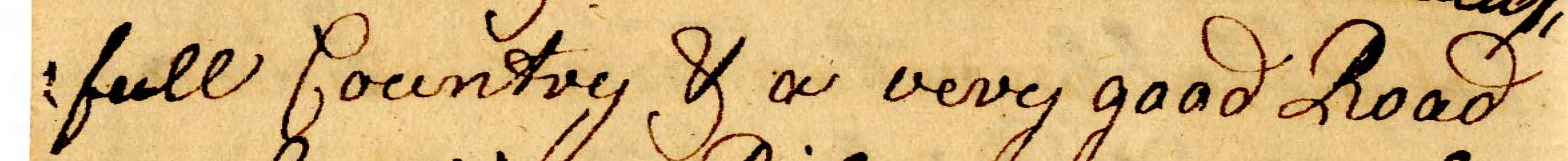-full Country & a very good Road
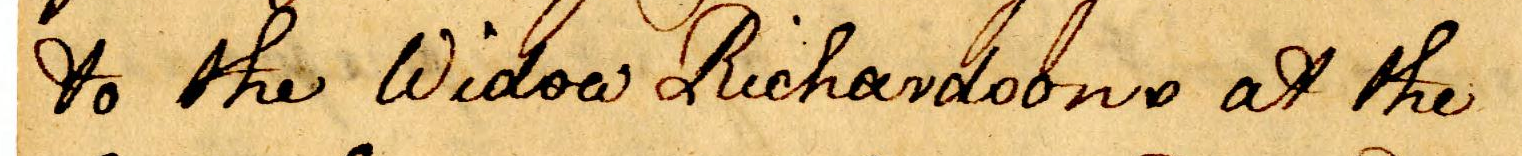to the Widow Richardsons at the
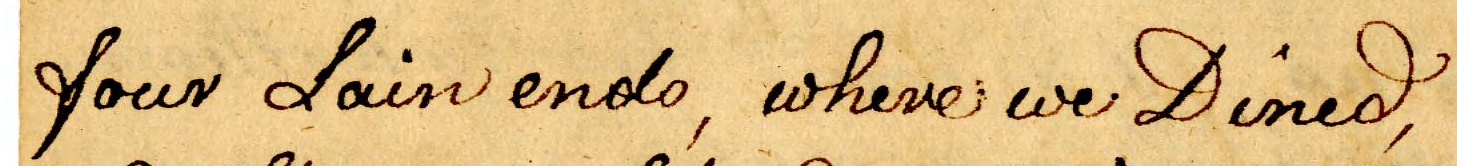four Lain ends, where we Dined,
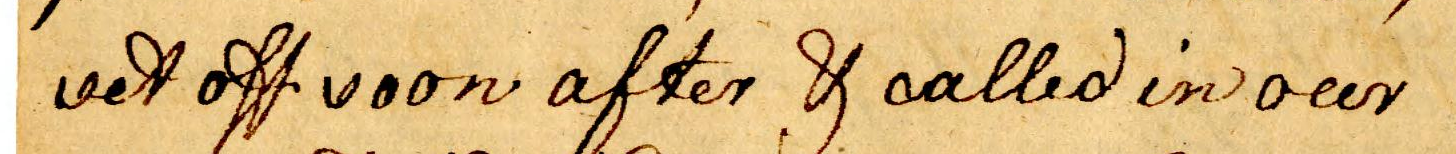set off soon after & called in our
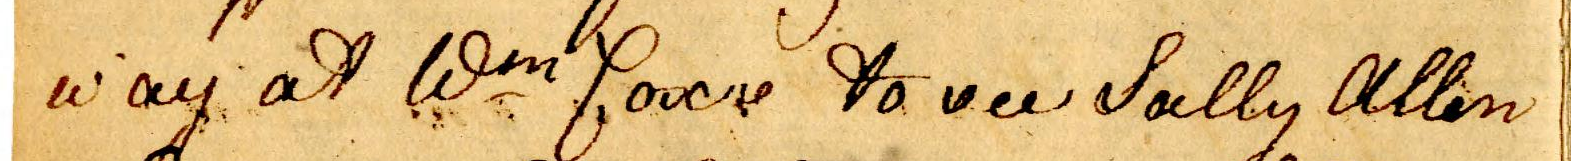way at W^m Coxs to see Sally Allen
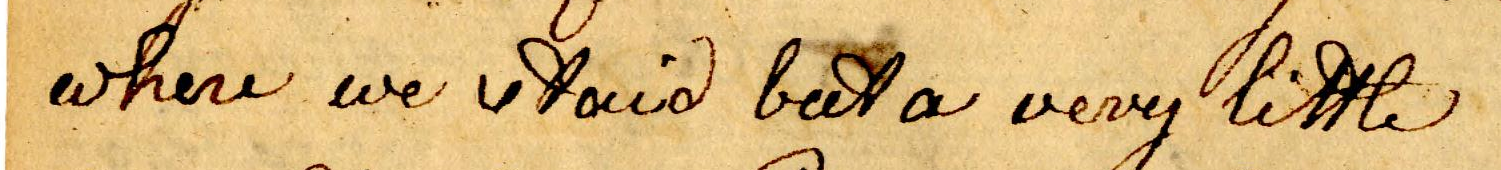where we staid but a very little
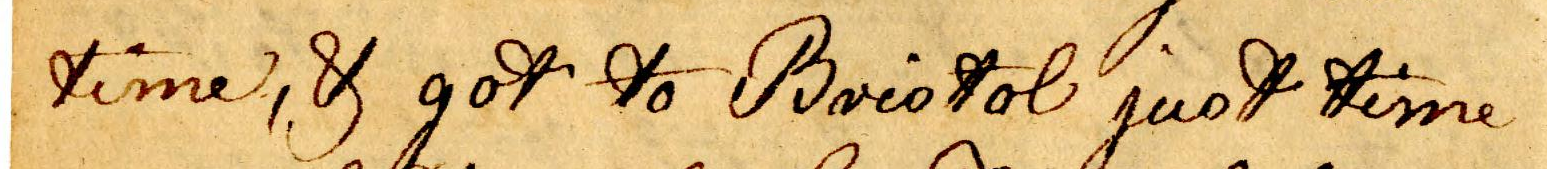time, & got to Bristol just time
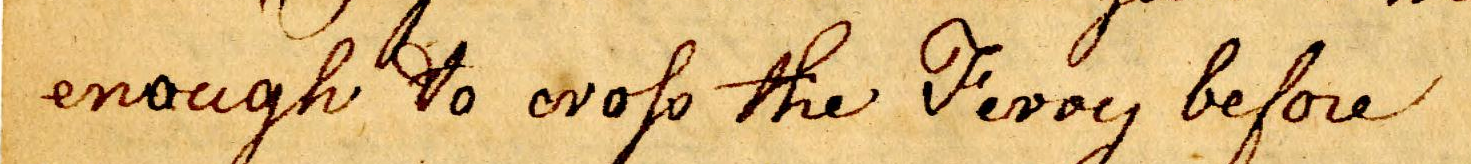enough to cross the Ferry before
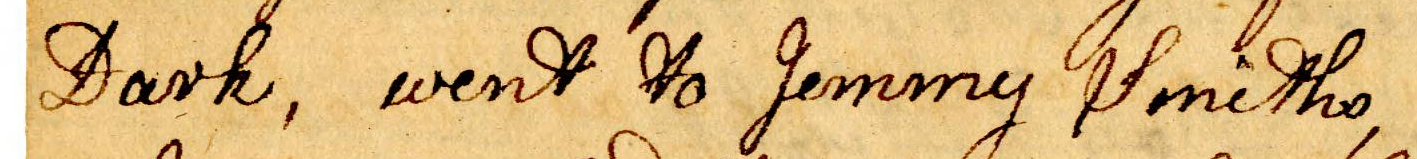Dark, went to Jemmy Smiths,
